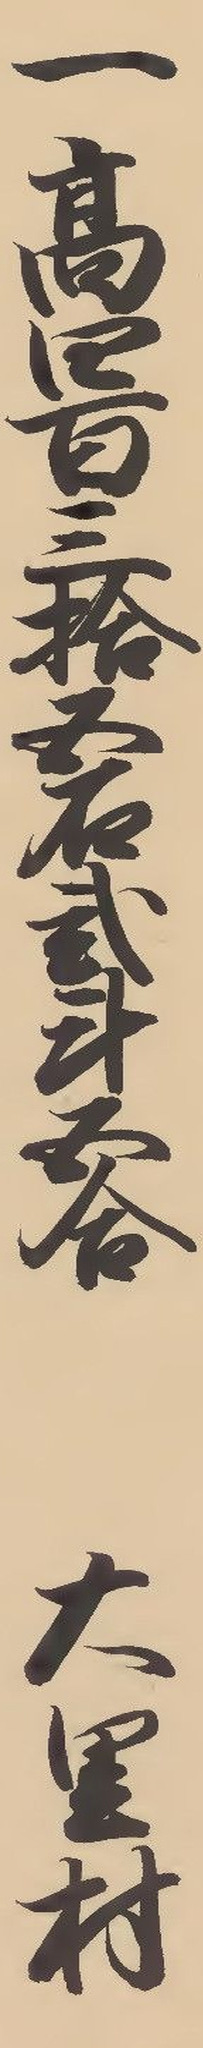一高四百三拾五石弐斗五合大里村
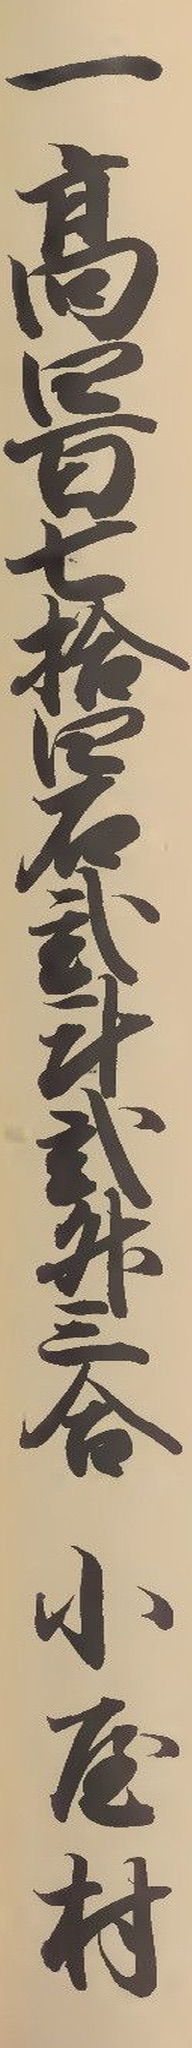一高四百七拾四石弐斗弐升三合小屋村
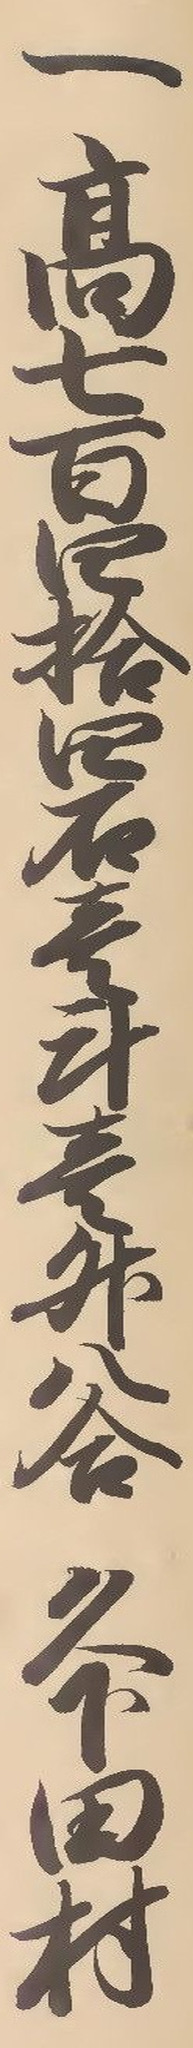一高七百四拾四石壱斗壱升八合久下田村
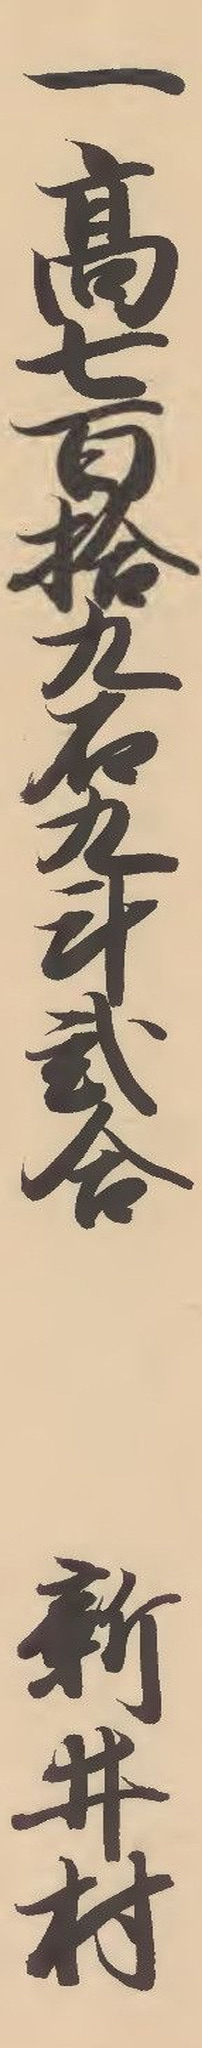一高七百拾九石九斗弐合新井村
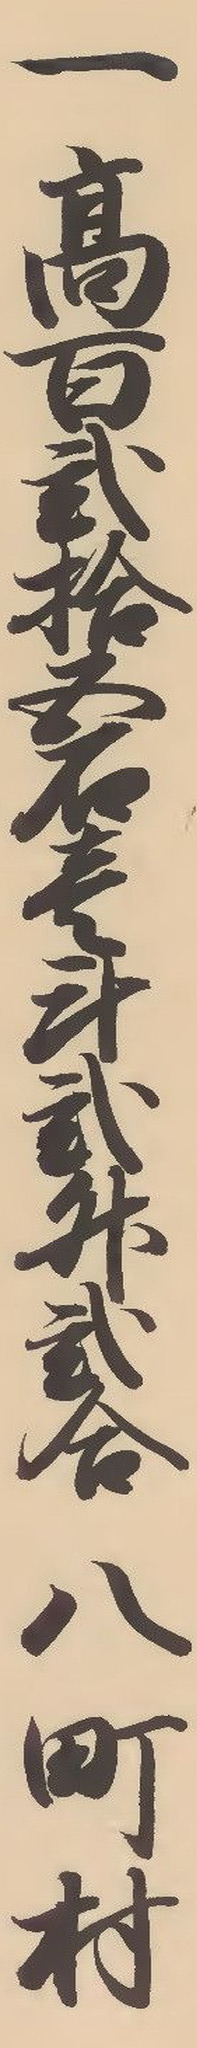一高百弐拾五石壱斗弐升弐合八町村
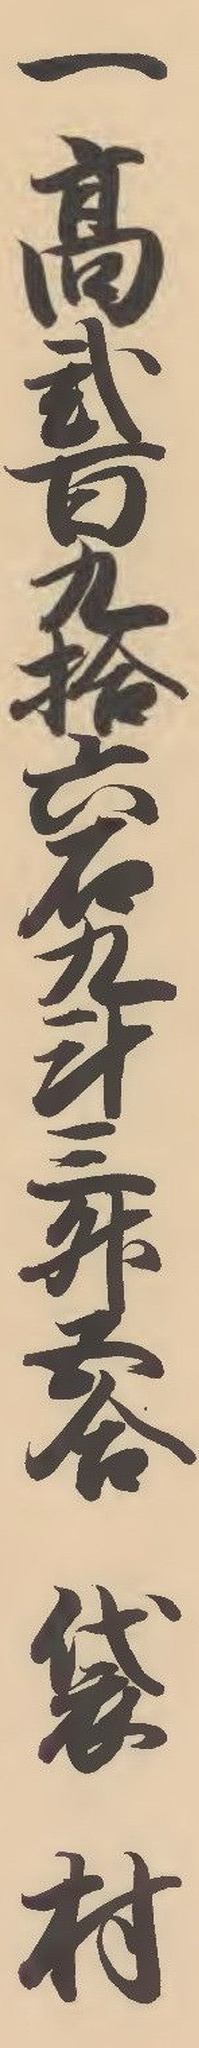一高弐百九拾六石九斗三升五合袋村

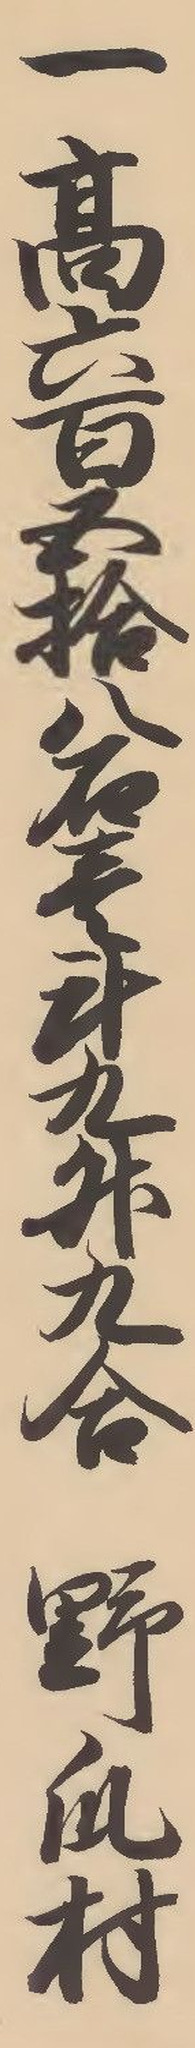一高六百五拾八石壱斗九升九合野爪村
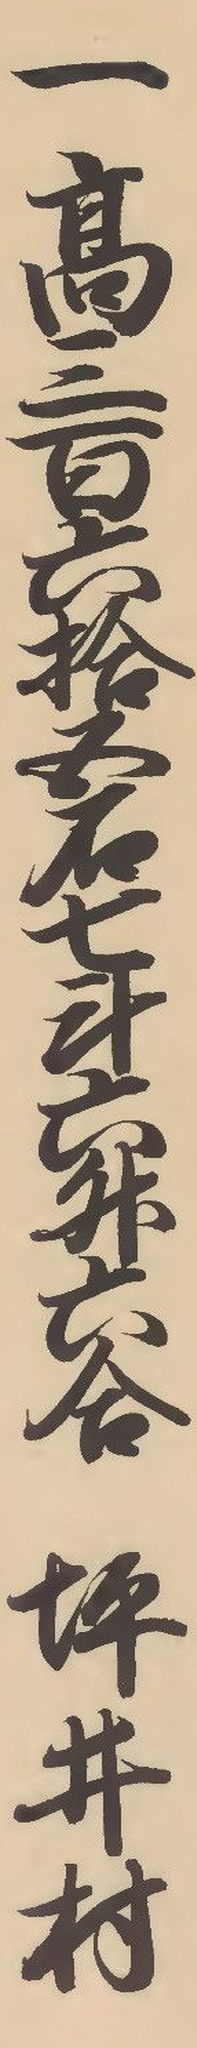一高三百六拾五石七斗六升六合坪井村
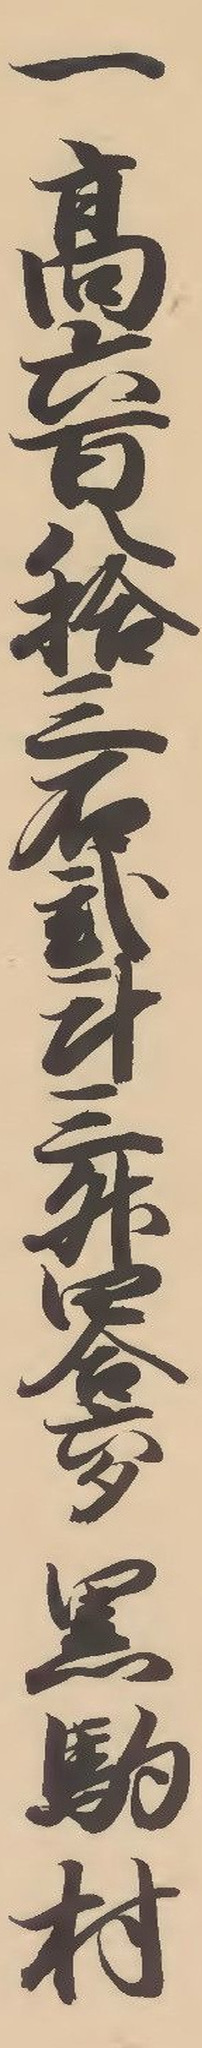一高六百八拾三石弐斗三升四合六勺黒駒村
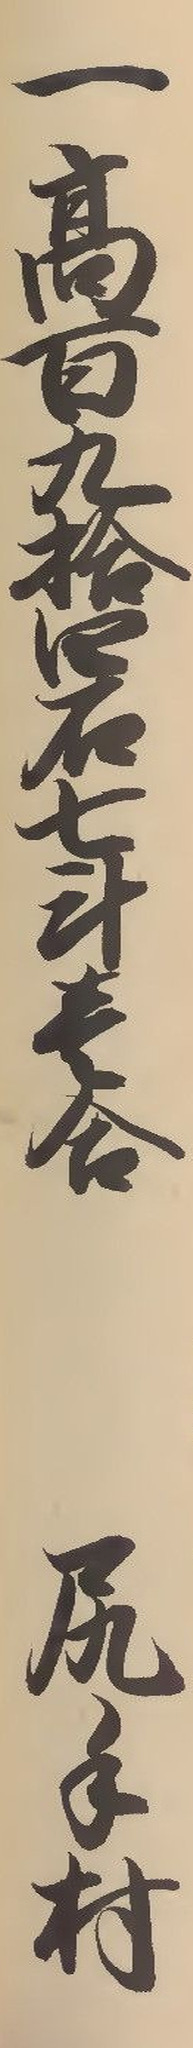一高百九拾四石七斗壱合尻手村
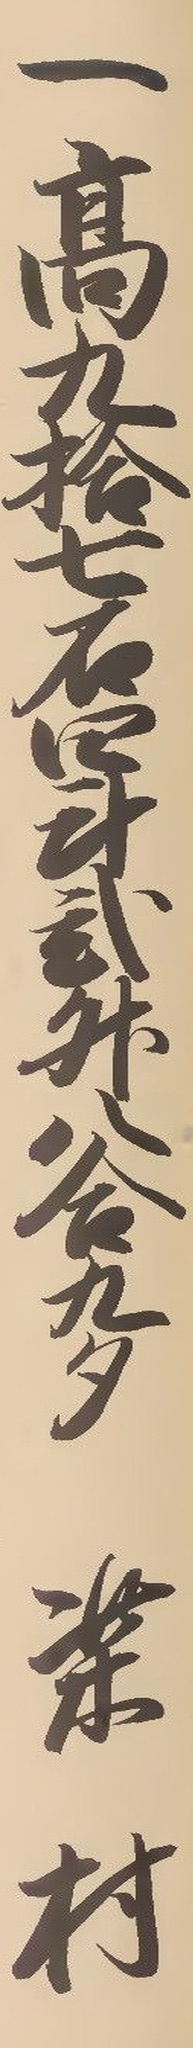一高九拾七石四斗弐升八合九勺柴村
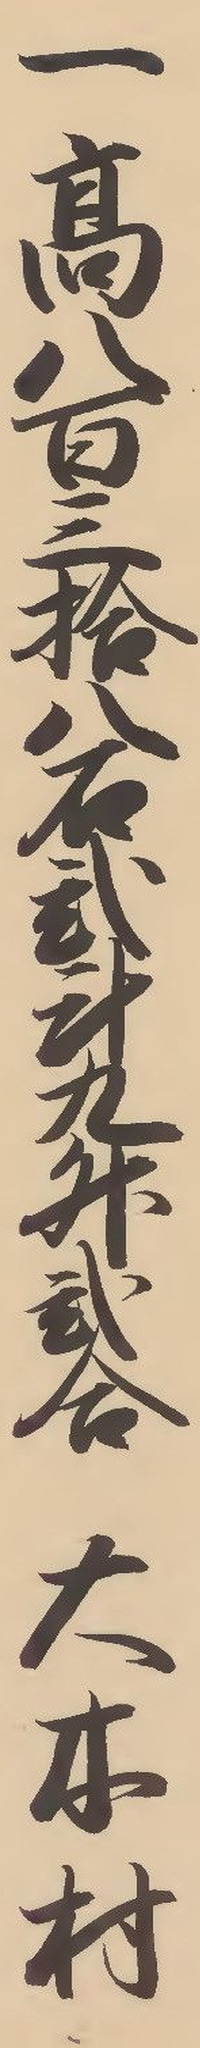一高八百三拾八石弐斗九升弐合大木村
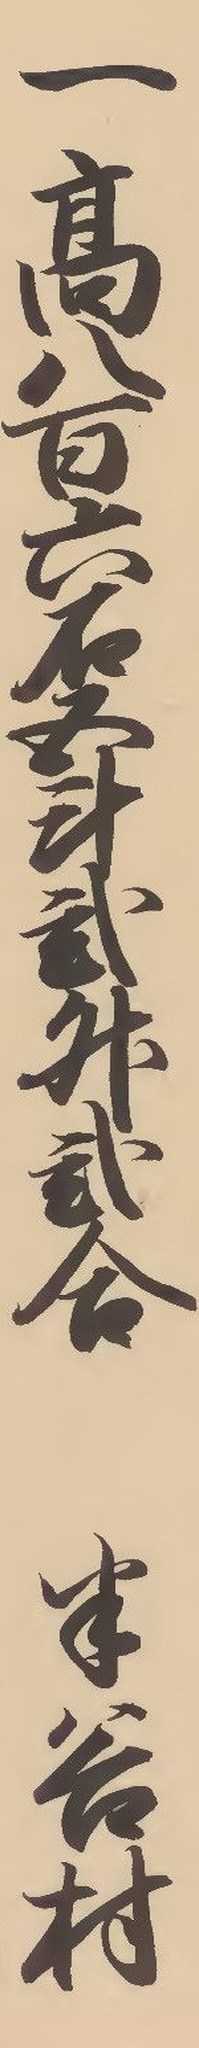一高八百六石五斗弐升弐合半谷村
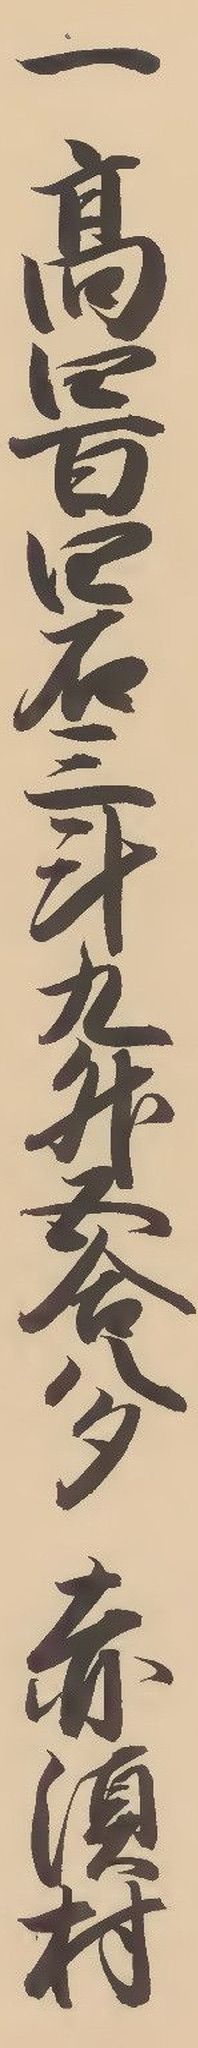一高四百四石三斗九升五合八勺赤須村

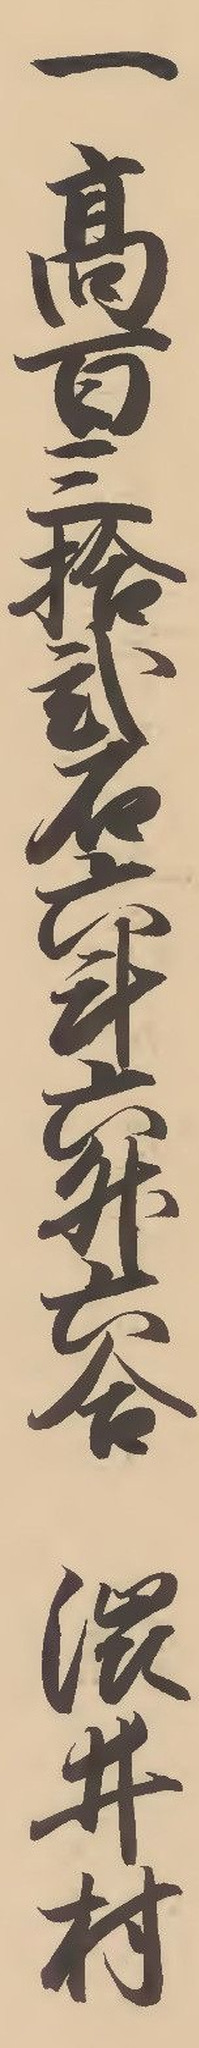一高百三拾弐石六斗六升六合渋井村
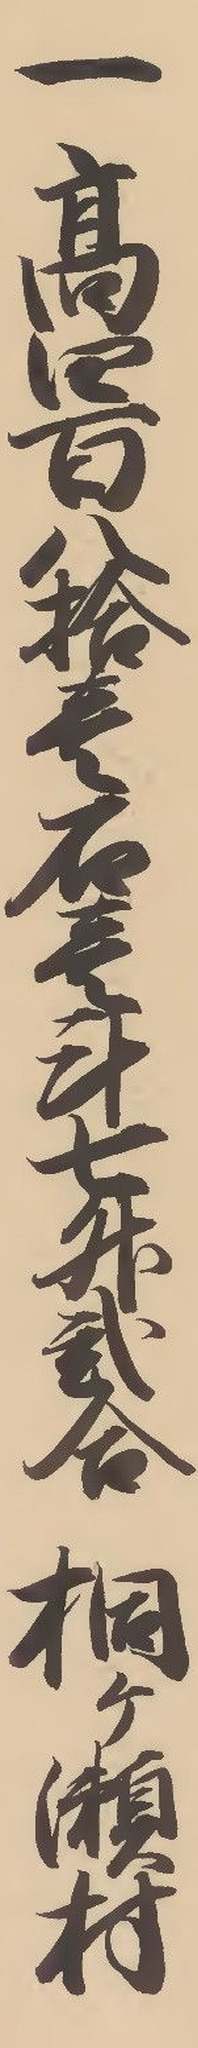一高四百八拾壱石壱斗七升弐合桐ヶ瀬村
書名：常陸国郷帳
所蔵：国立公文書館 National Archives of Japan
